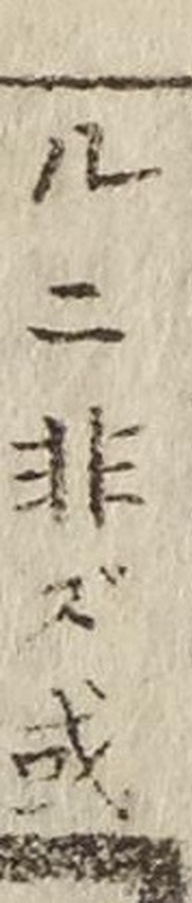ルニ非ズ或
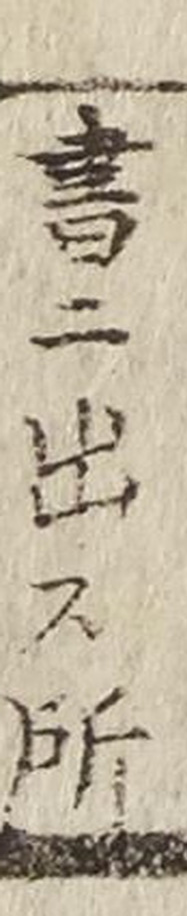書ニ出ス所
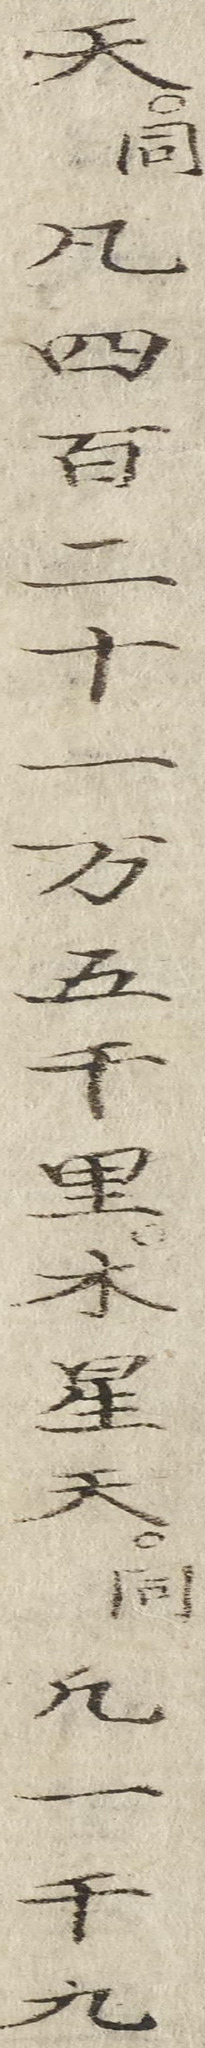天。同凡四百二十一万五千里。木星天。同凡一千九
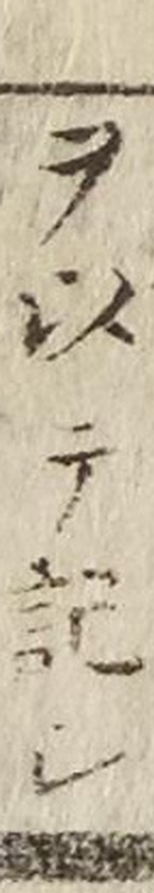ヲ以テ記シ
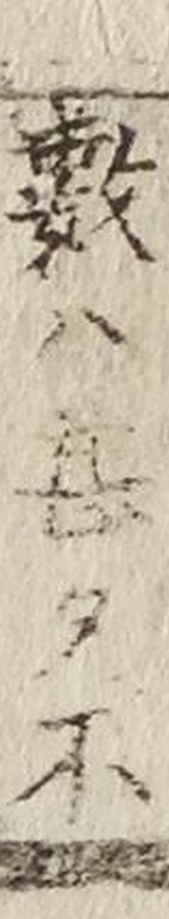数ハ甚タ不
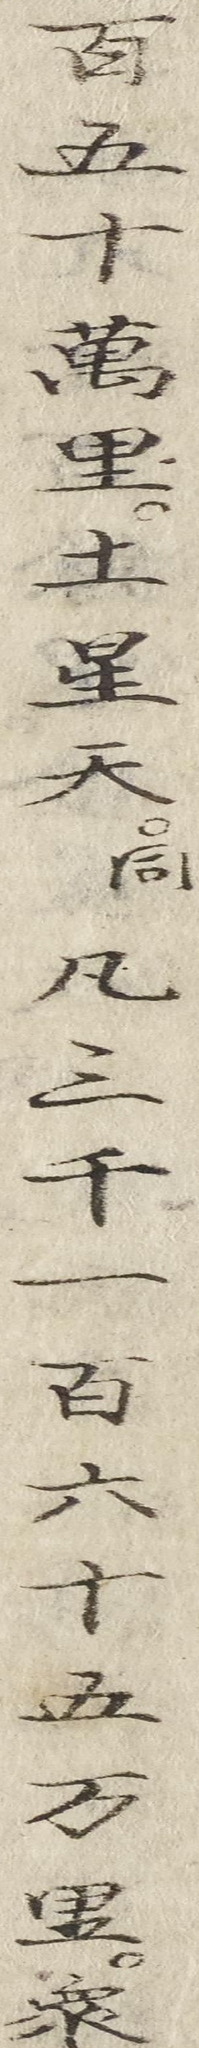百五十万里。土星天。同凡三千百六十五万里。衆
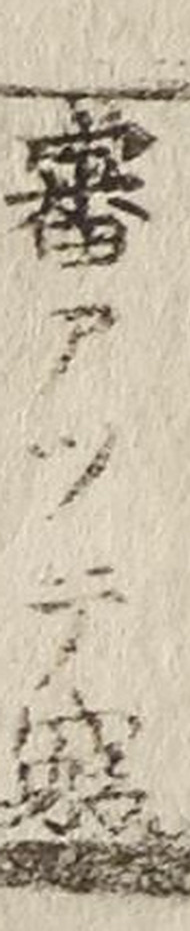審アツテ窮
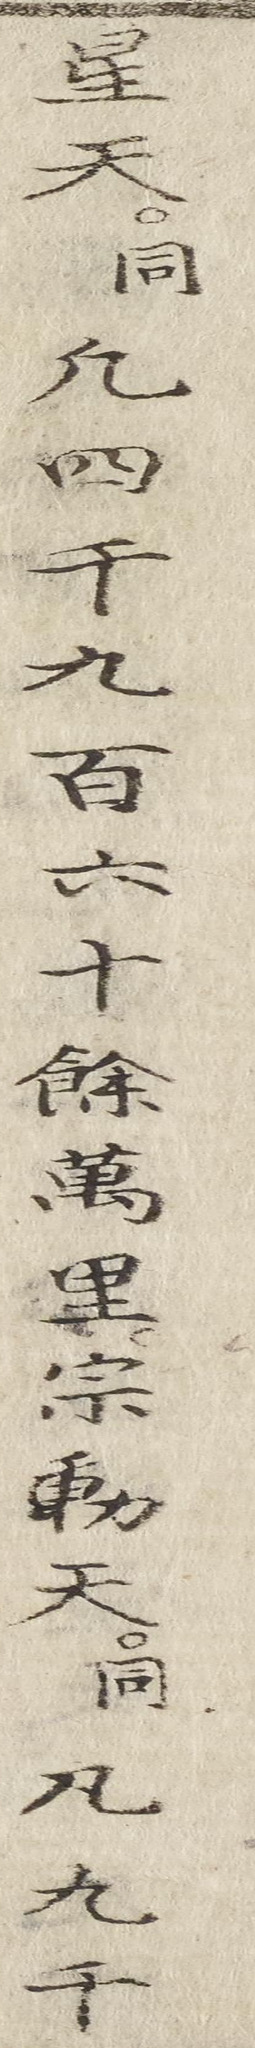星天。同凡四千九百六十余万里。宗動天。同凡九千
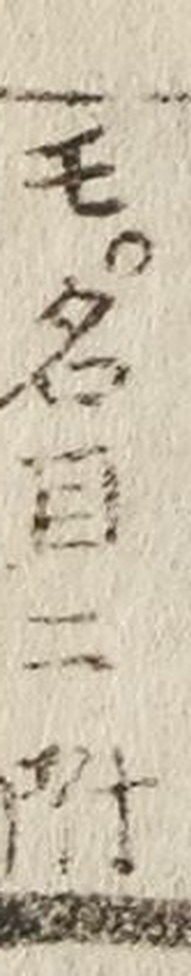モ。名目ニ附
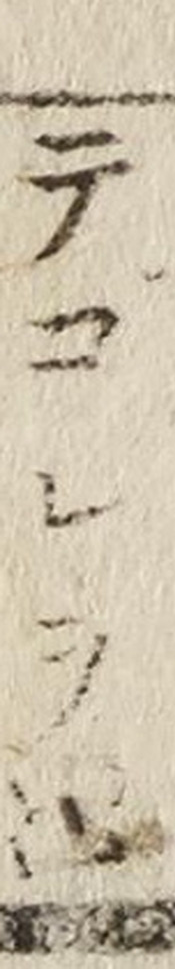テコレヲ記
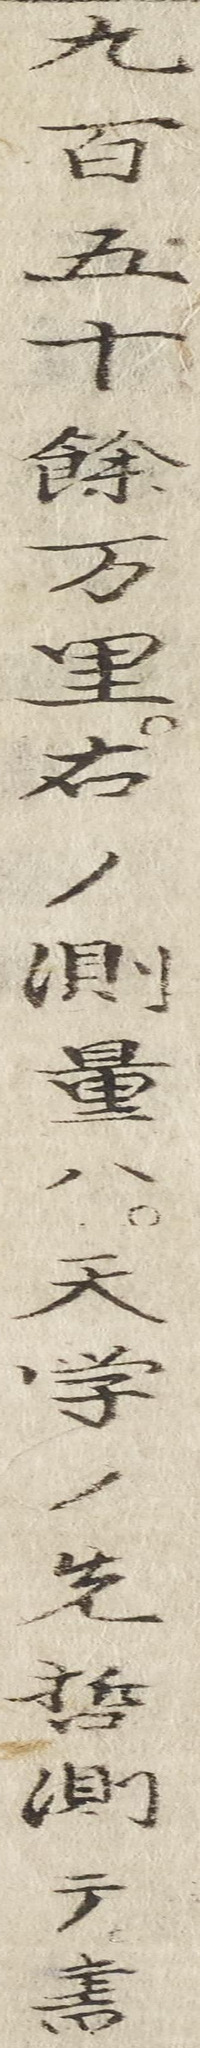九百五十余万里。右ノ測量ハ。天学ノ先哲測テ書
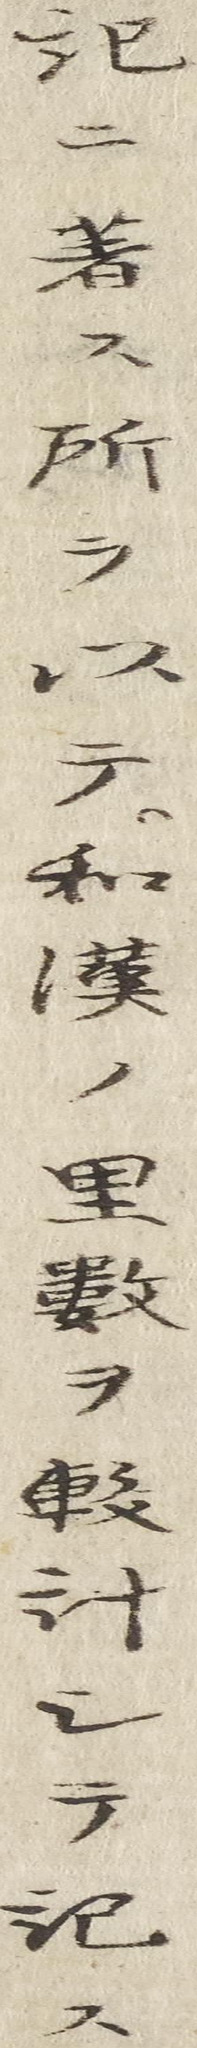記ニ著ス所ヲ以テ。和漢ノ里数ヲ較計シテ記ス
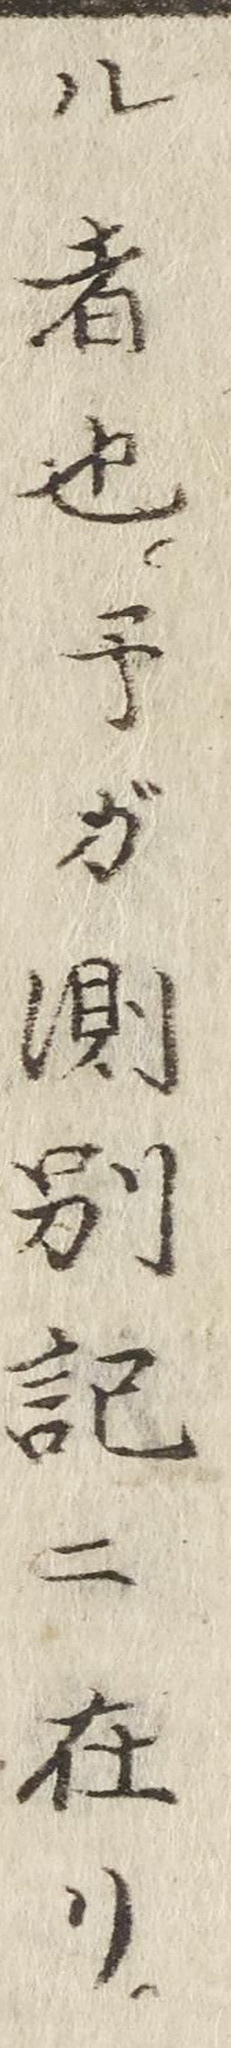ル者也。予ガ測別記ニ在リ。
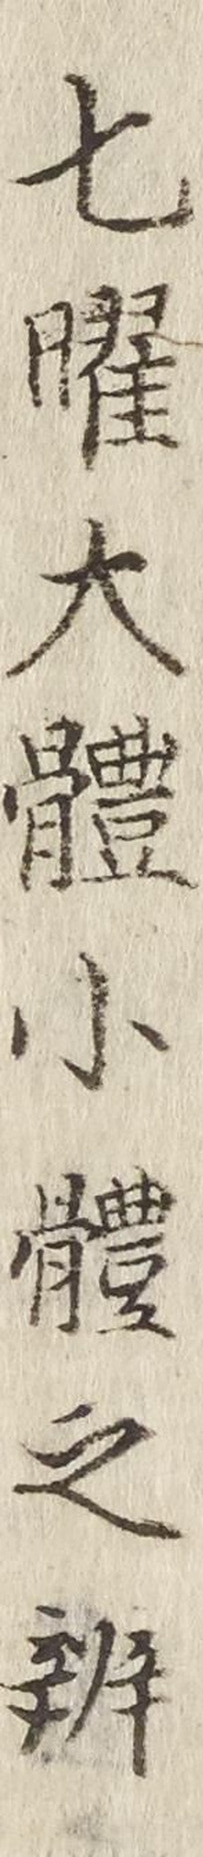七曜大体小体之弁
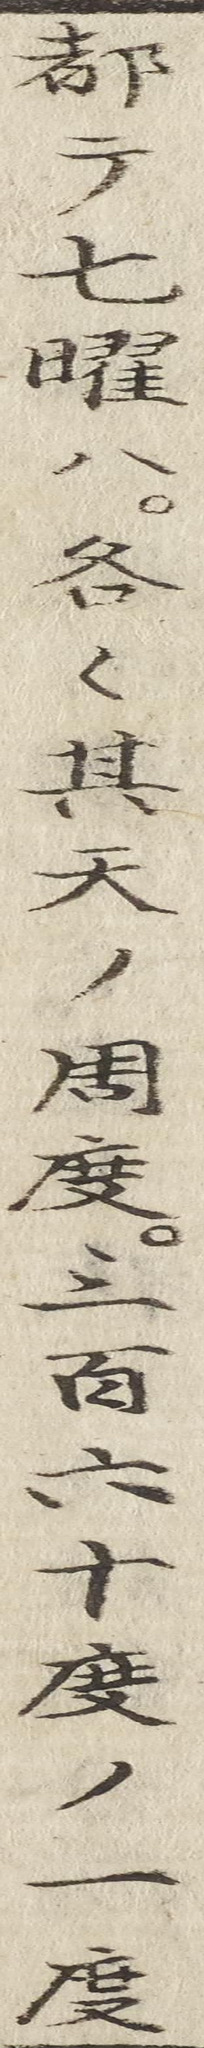都テ七曜ハ。各々其天ノ周度。三百六十度ノ一度
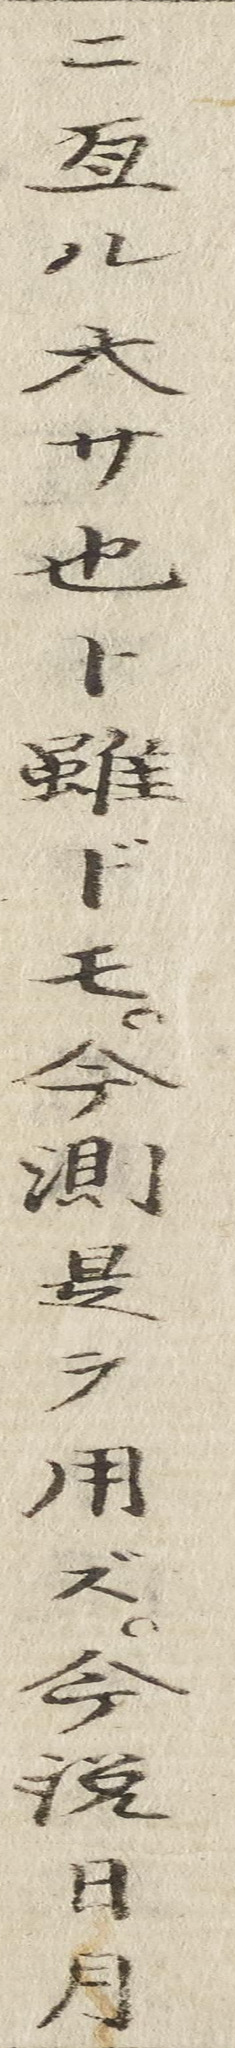ニ亙ル大サ也ト雖ドモ。今測是ヲ用ズ。今説日月
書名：大略天学名目鈔　天經或問附録
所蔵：東京大学地震研究所図書室 Earthquake Research Institute Library, The University of Tokyo, JAPAN
